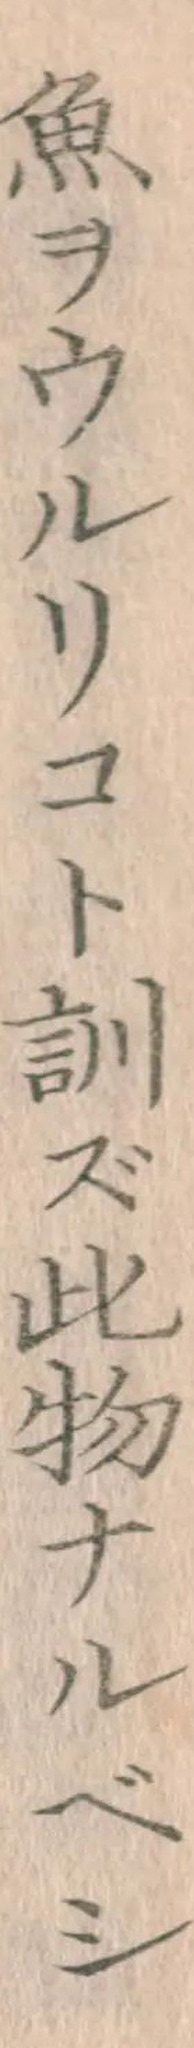魚ヲウルリコト訓ズ此物ナルベシ
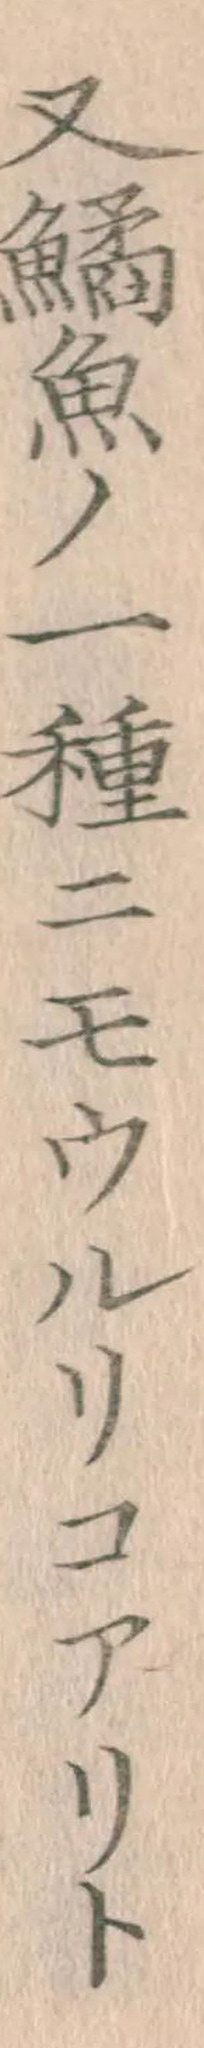又鱊魚ノ一種ニモウルリコアリト
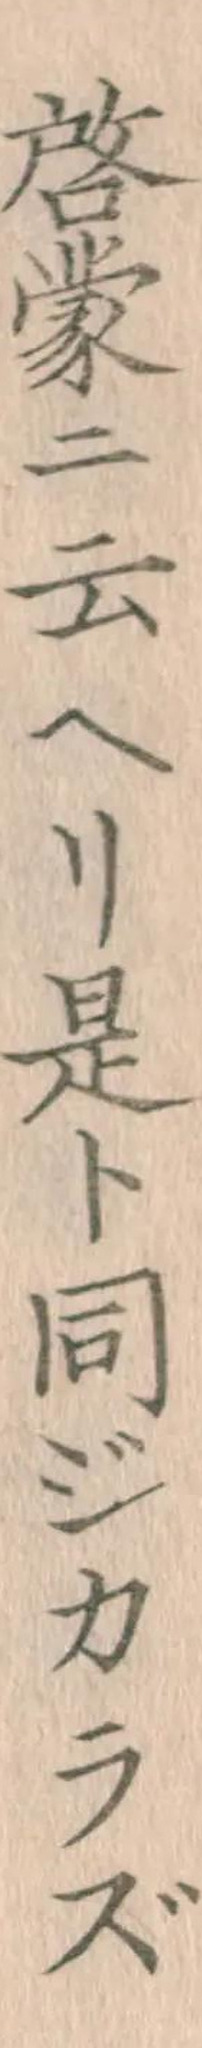啓蒙ニ云ヘリ是ト同ジカラズ

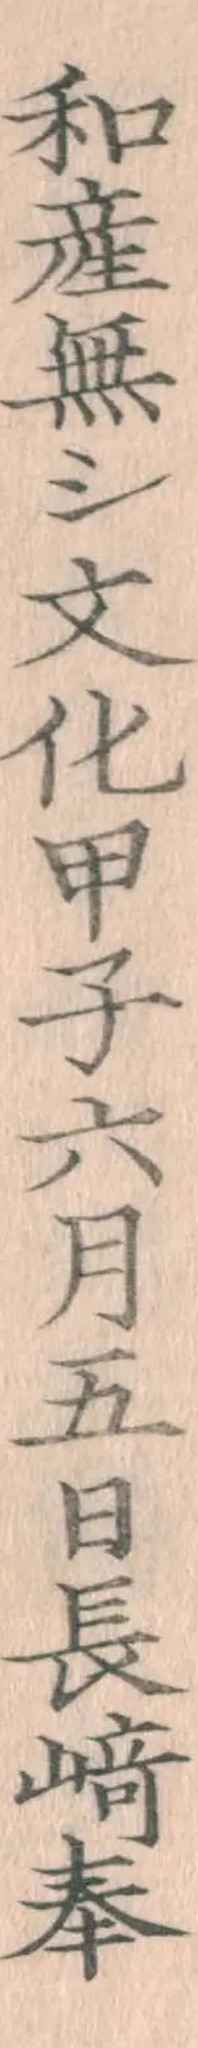和産無シ文化甲子六月五日長崎奉
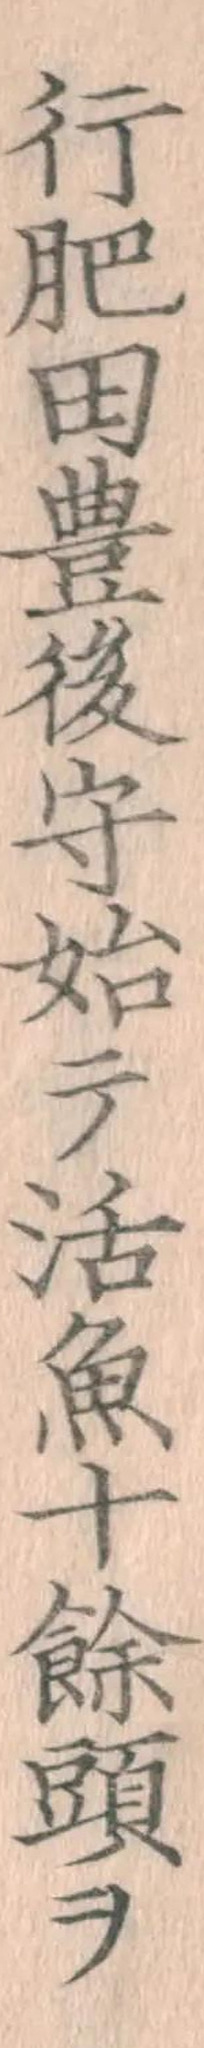行肥田豊後守始テ活魚十余頭ヲ
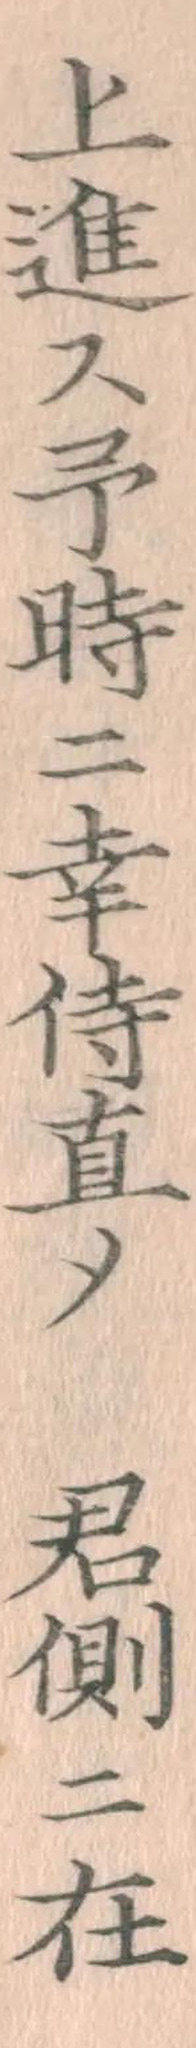上進ス予時ニ幸侍直シテ君側ニ在
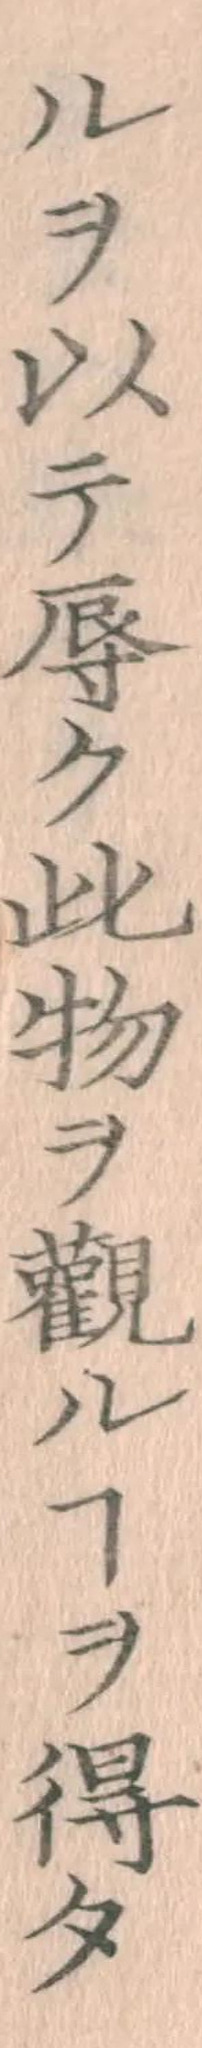ルヲ以テ辱ク此物ヲ観ルヿヲ得タ
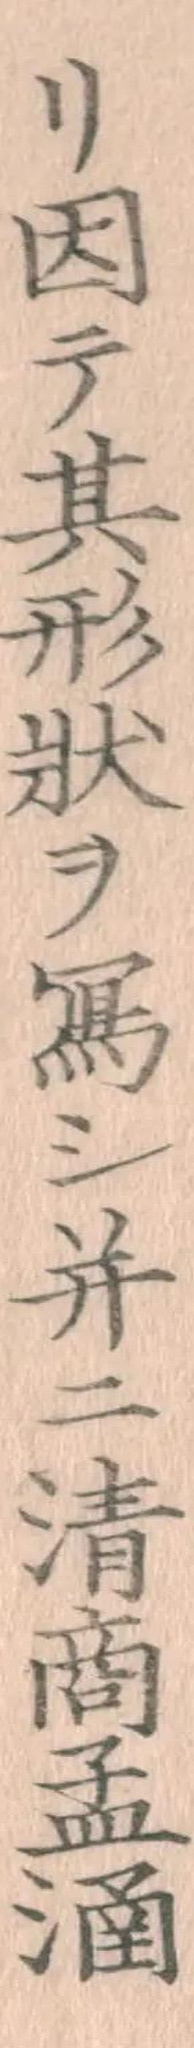リ因テ其形状ヲ写シ并ニ清商孟涵
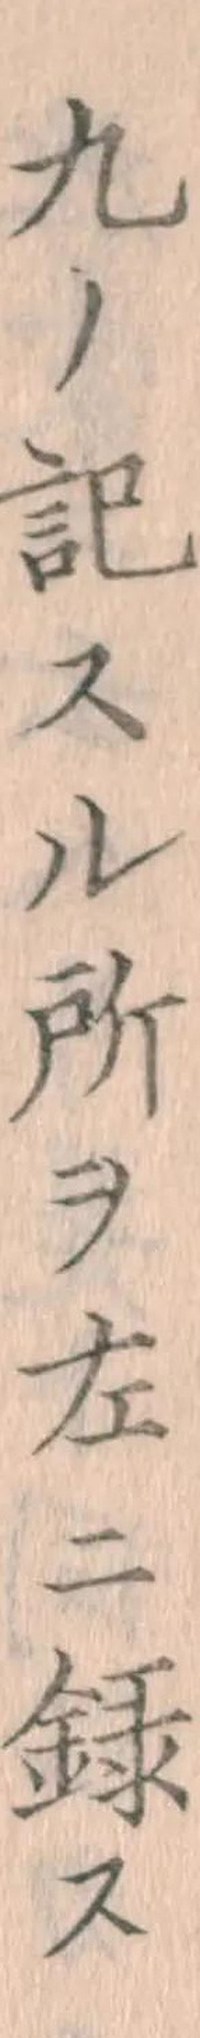九ノ記スル所ヲ左ニ録ス
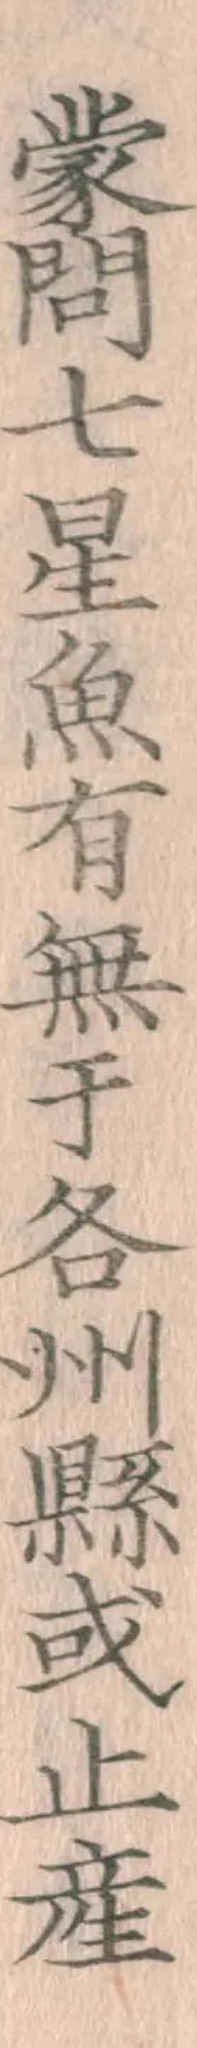蒙問七星魚有無于各州県或止産
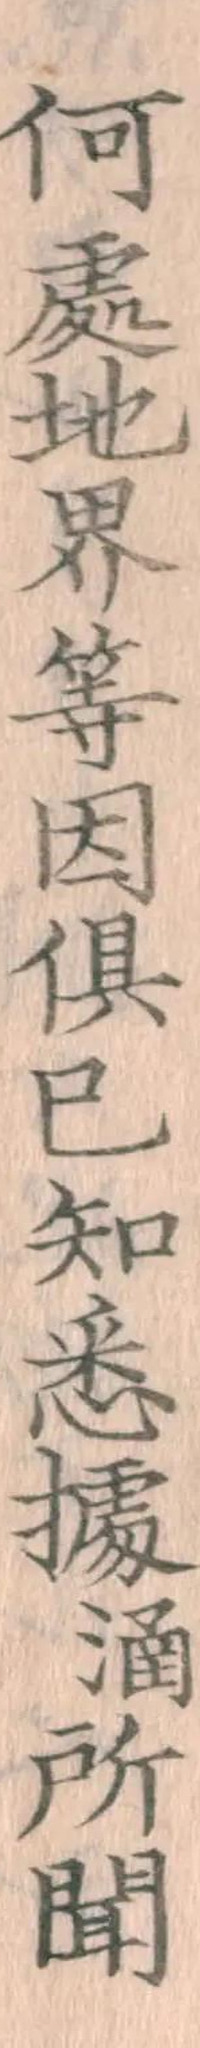何処地界等因俱巳知悉拠涵所聞
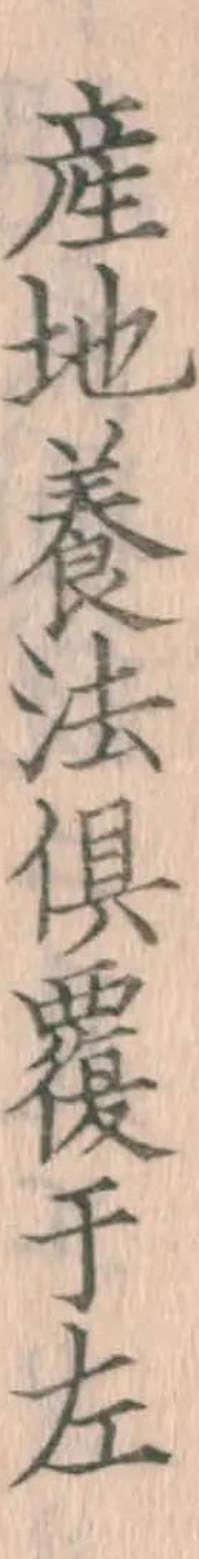産地養法俱覆于左
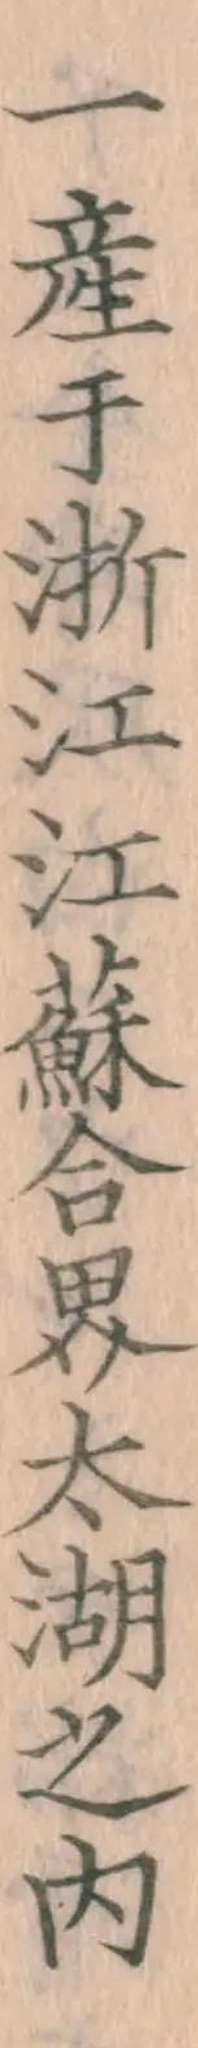一産于浙江江蘇合界太湖之内
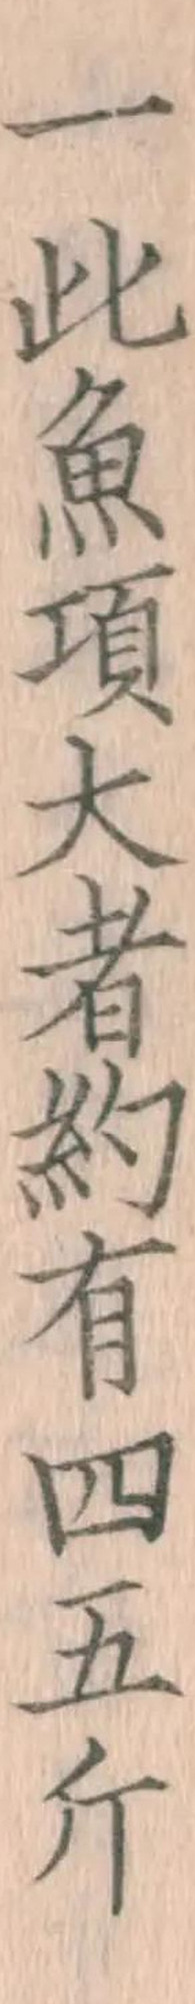一此魚項大者約有四五斤
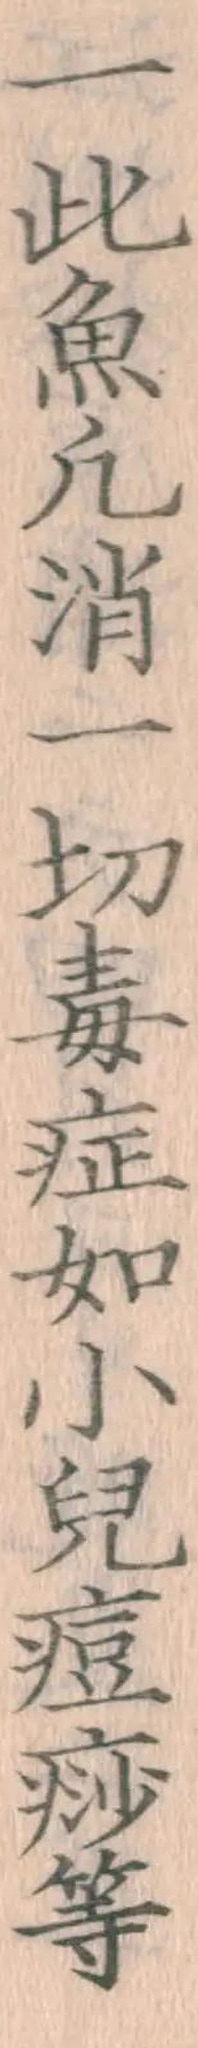一此魚凡消一切毒症如小児痘痧等
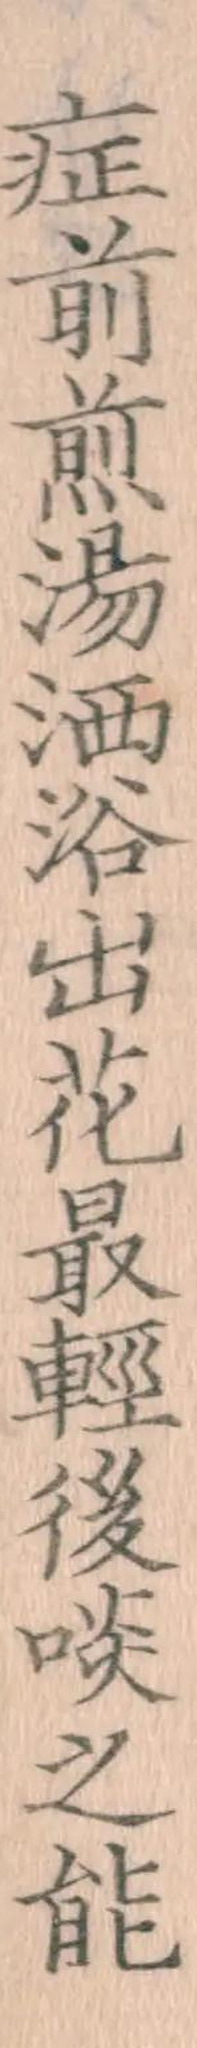症前煎湯洒浴出花最軽後啖之能
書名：皇和魚譜 2巻
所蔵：国立国会図書館 National Diet Library, JAPAN
